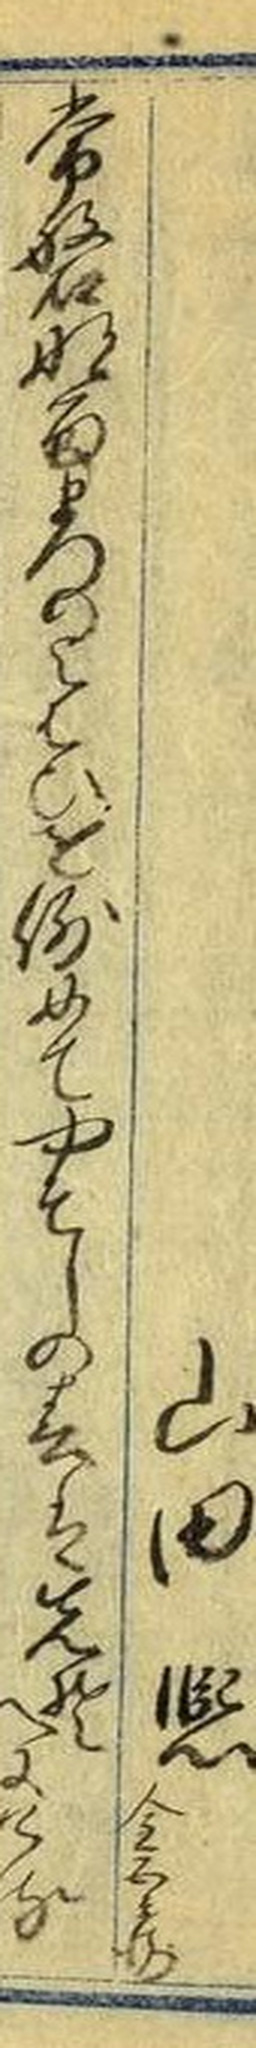常盤なるまつのよはひを揃にてやそしの春は先そへにける
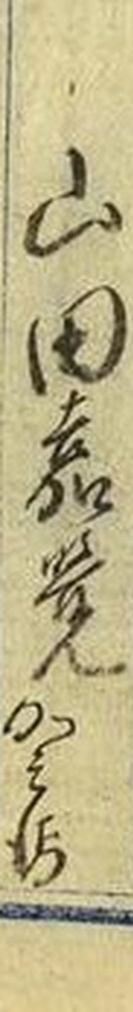山田嘉覺加兵衛
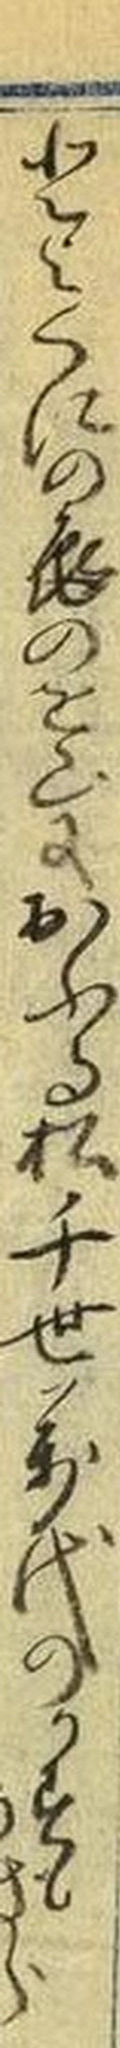とよくにの亀のを山におふる松千世萬代のかすもかきらし
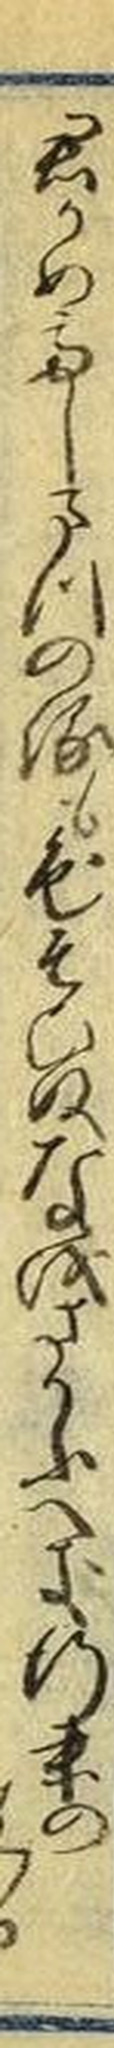君かめてしまつの緑も色そひぬなをさかふへき行末のはる
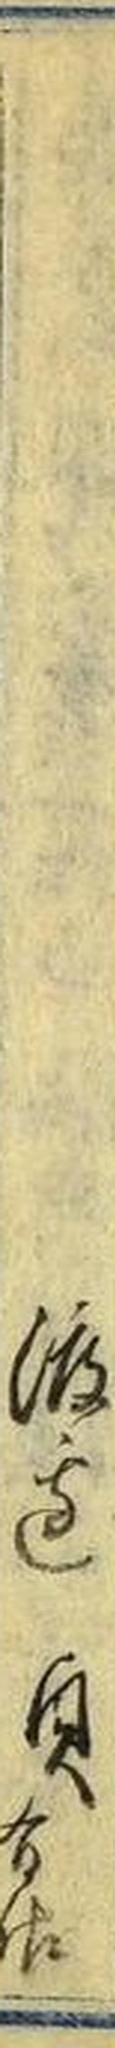渡邊貞有祐
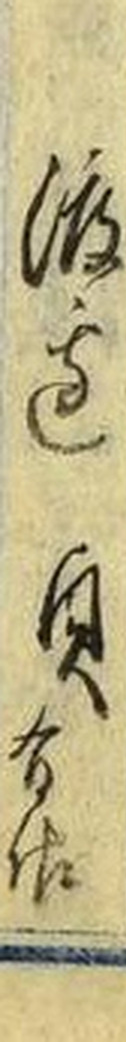渡邊貞有祐
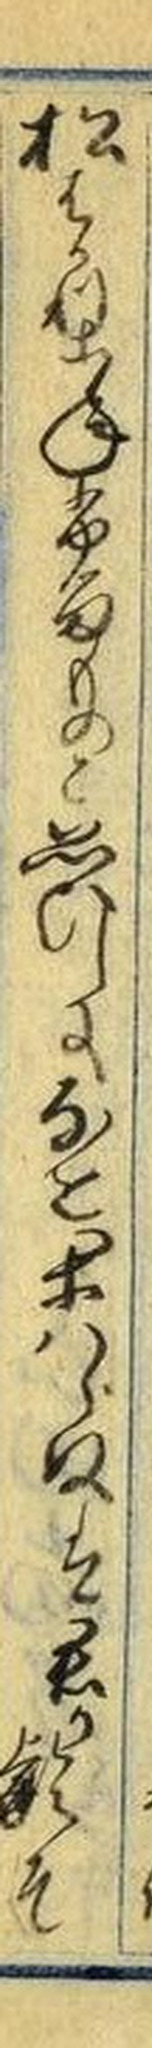松はかり年ふるものと思ひしになをかはらぬは君か齢そ

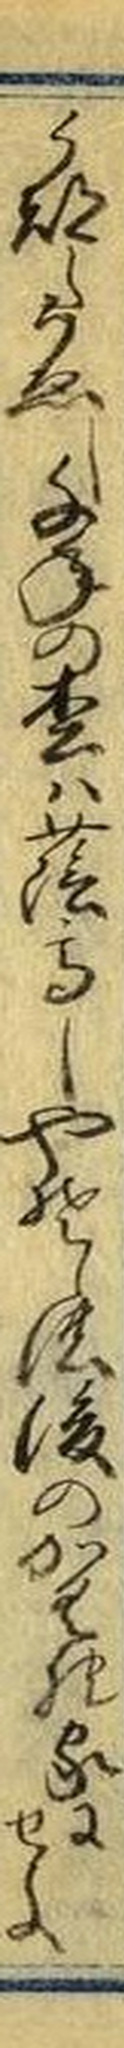うつしかゑし千年の松は蔭高しやそしの後のかくれ家にせよ
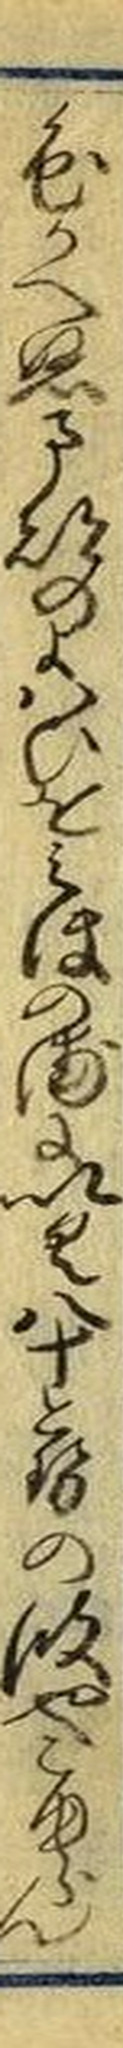色かへぬまつのよはひをみほの浦にいく八十とせの波やこゆらん
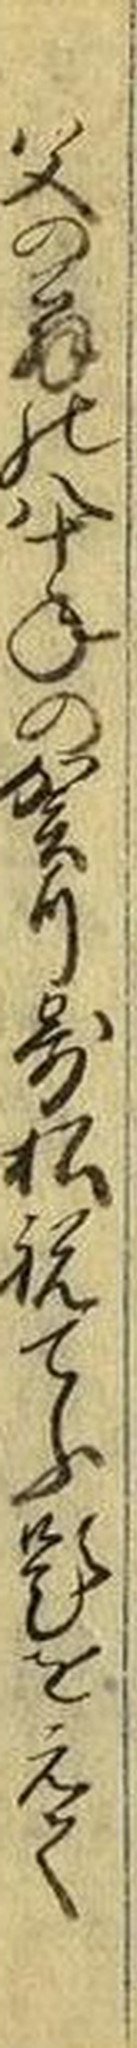父の翁の八十年の賀に寄松祝てふ題をえて
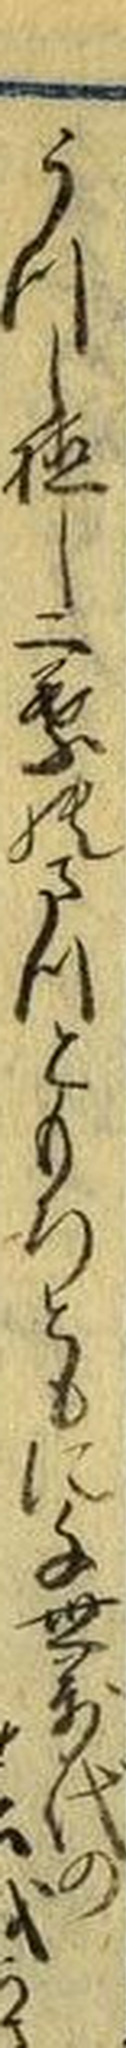うつし植し二葉のまつともろともに千世萬代の春をかさねむ
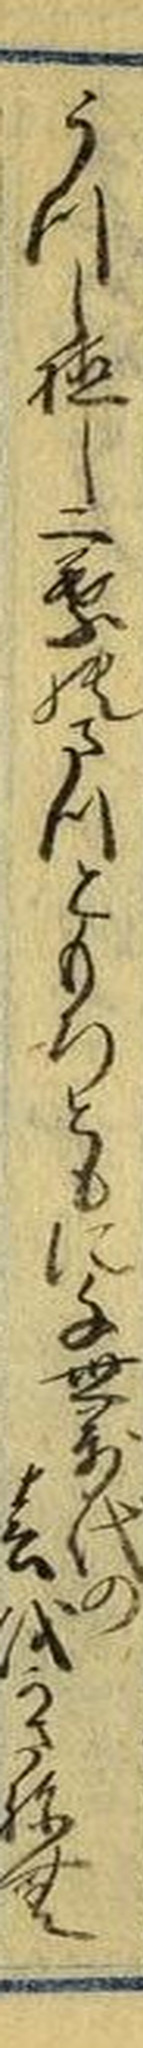うつし植し二葉のまつともろともに千世萬代の春をかさねむ
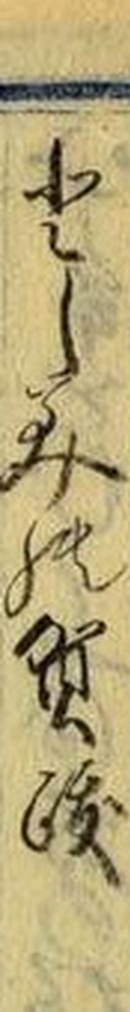としみの賀跋
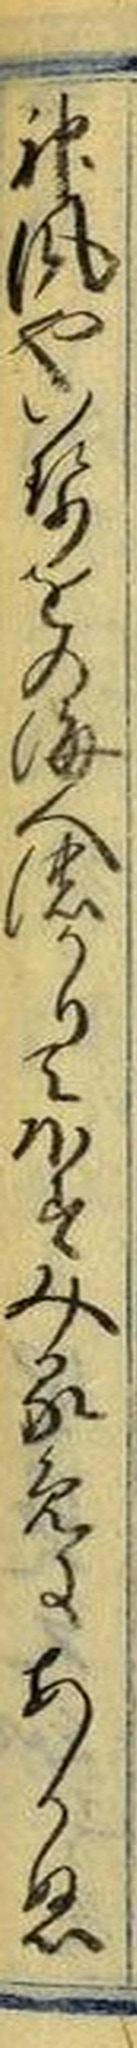神風やいせをの海人のかりてほすみるめにあかぬ
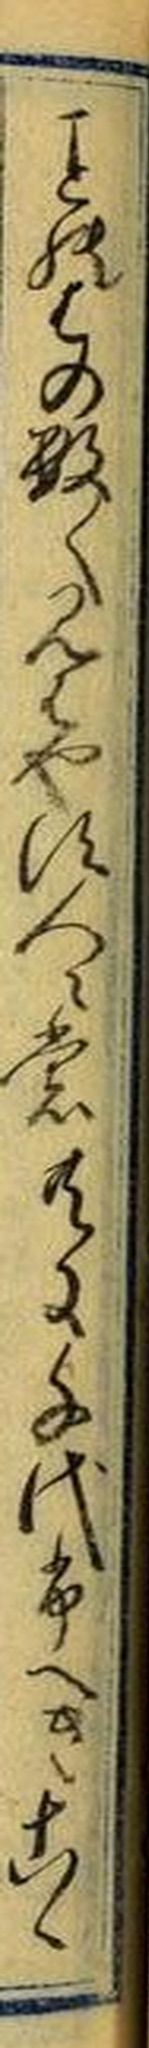ことのはの数々みはやす人々も共に千代ふへきこゝ
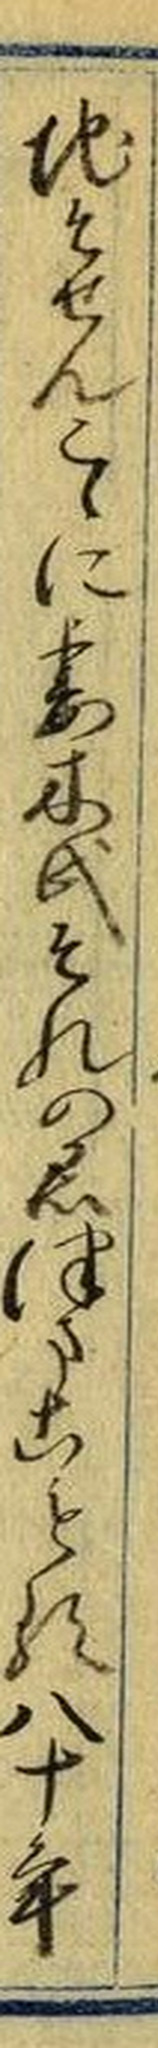ちそせんこゝに妻木氏それの君つまこもる八十年
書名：温古集 三巻
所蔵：福井県文書館 Fukui Prefectural Archives
